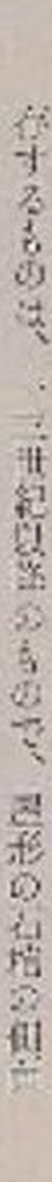存するものは、一三世紀以降のもので、形の石棺の側面
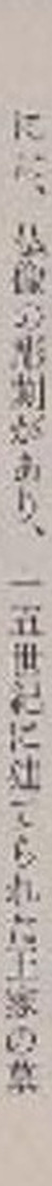には、仏像の彫刻があり、一五世紀に建てられた王家の墓
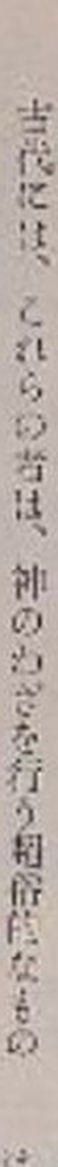古代には、これらの者は、神のわざを行う超俗的なもの
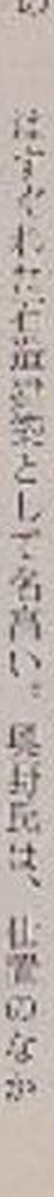はすぐれた石造建築として名高い。奥野氏は、仕置のなか
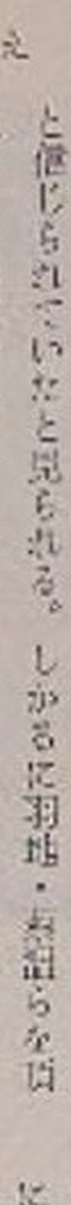と信じられていたと見られる。しかるに羽地・蔡温らを頂
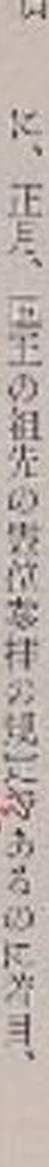に、正月、国王の祖先の参拝の規定があるのに着目、
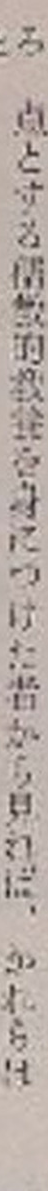点とする儒教的教養を身につけた者から見れば、かれらは
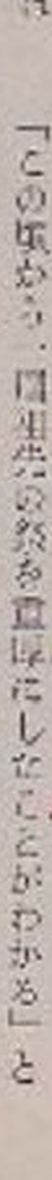「この頃から一国祖先の祭を重厚にしたことがわかる」と
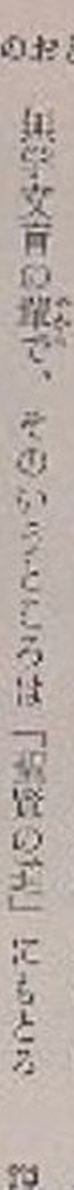無学文盲の輩で、そのいうところは「聖賢の道」にもとる
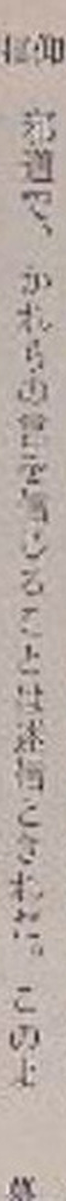邪道で、かれらの言を信じることは迷信とされた。このよ
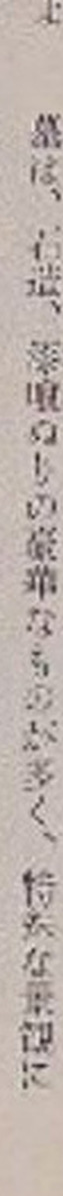墓は、石造、漆喰ぬりの豪華なものが多く、特殊な景観に
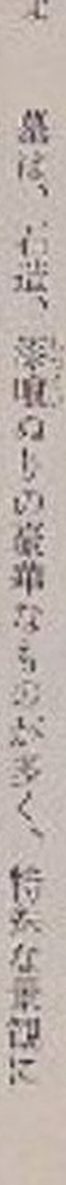墓は、石造、漆喰ぬりの豪華なものが多く、特殊な景観に
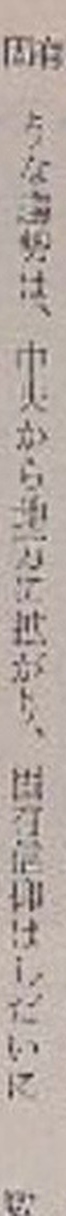うな趨勢は、中央から地方に拡がり、固有信仰はしだいに
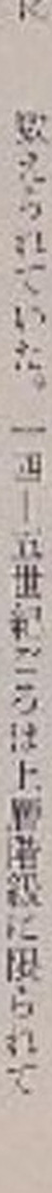数えられていた。一四―五世紀ごろは上層階級に限られて
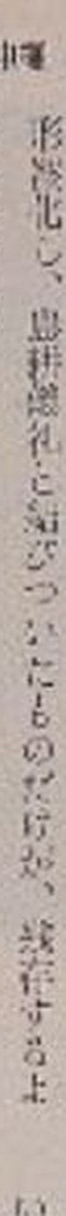形骸化し、農耕儀礼と結びついたものだけが、残存するよ
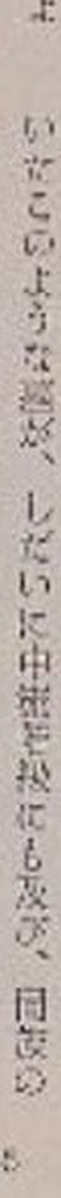いたこのような墓が、しだいに中階級にも及び、同族の
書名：沖縄固有信仰のおとろえ
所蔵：University of the Ryukyus Library
